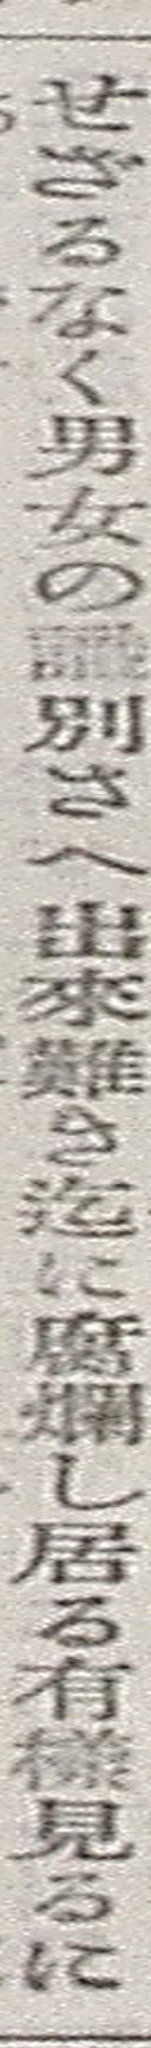せざるなく男女の識別さへ出来難き迄に腐爛し居る有様見るに
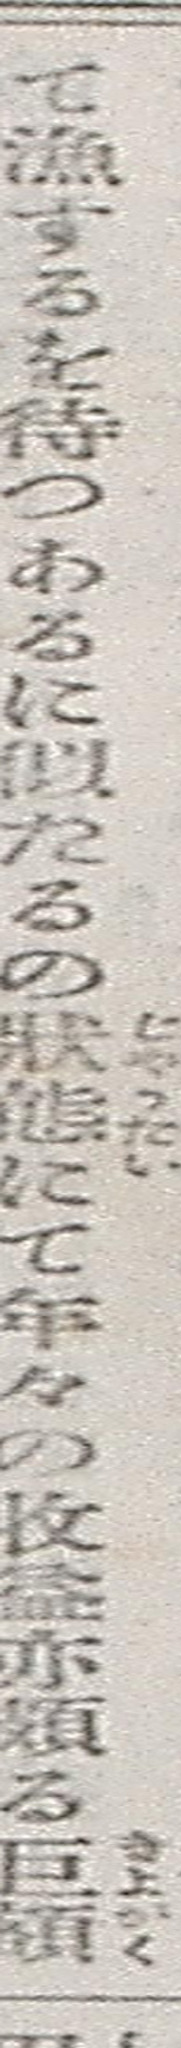て漁するを待つあるに似たるの状態にて年々の収益亦頗る巨額
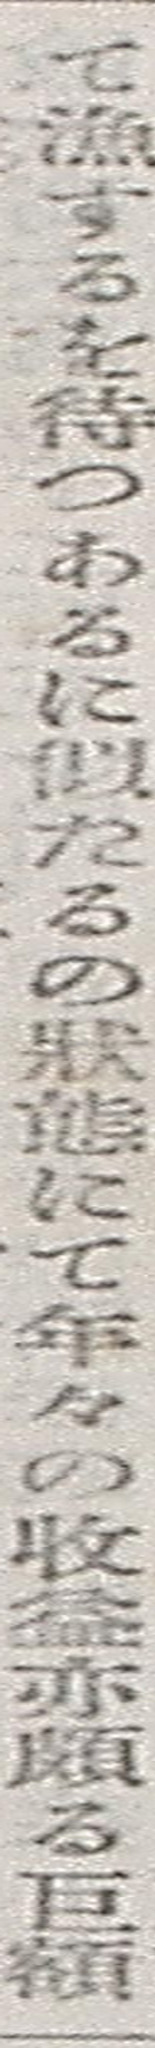て漁するを待つあるに似たるの状態にて年々の収益亦頗る巨額
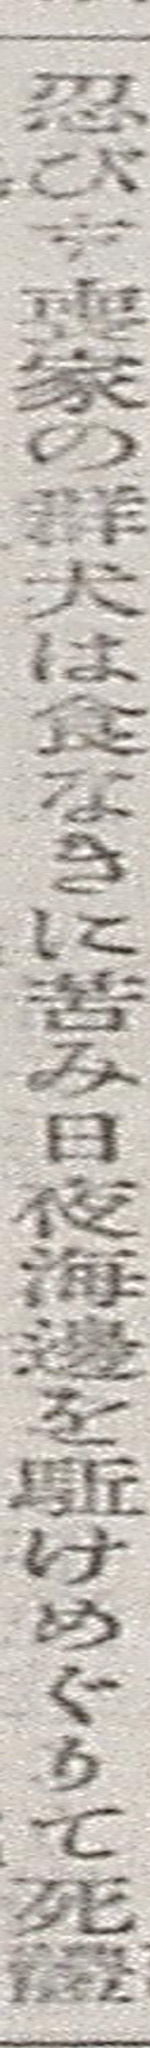忍びず喪家の群犬は食なきに苦み日夜海辺を駈けめぐりて死体
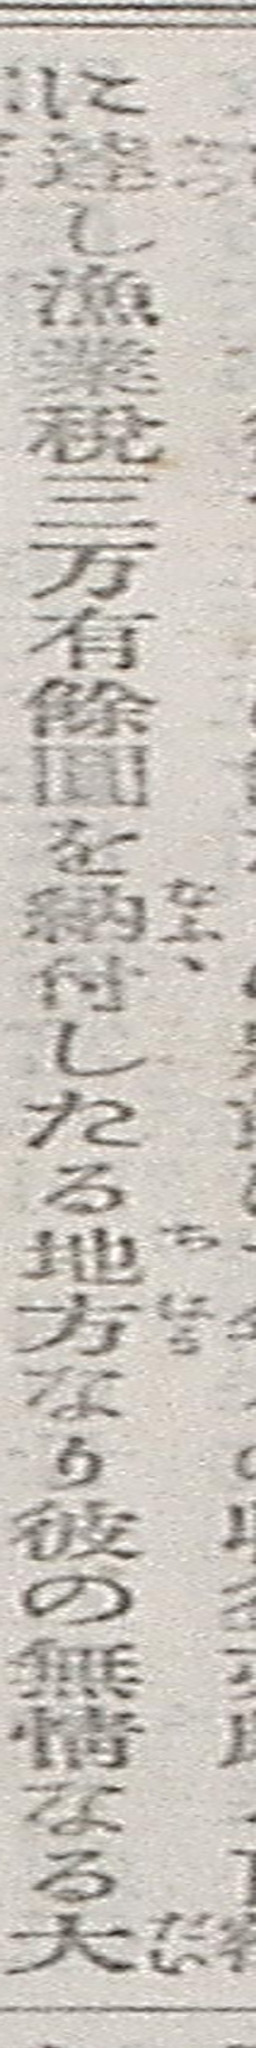に達し漁業税三万有余円を納付したる地方なり彼の無情なる大
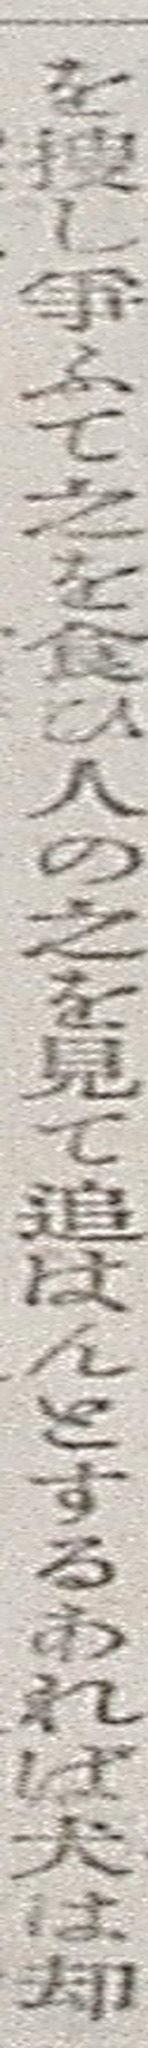を捜し争ふて之を食ひ人の之を見て追はんとするあれば犬は却
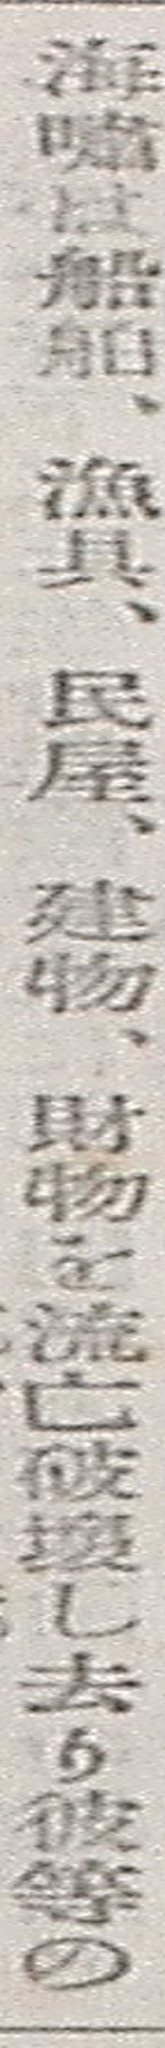海嘯は船舶、漁具、民屋、建物、財物を流亡破壊し去り彼等の
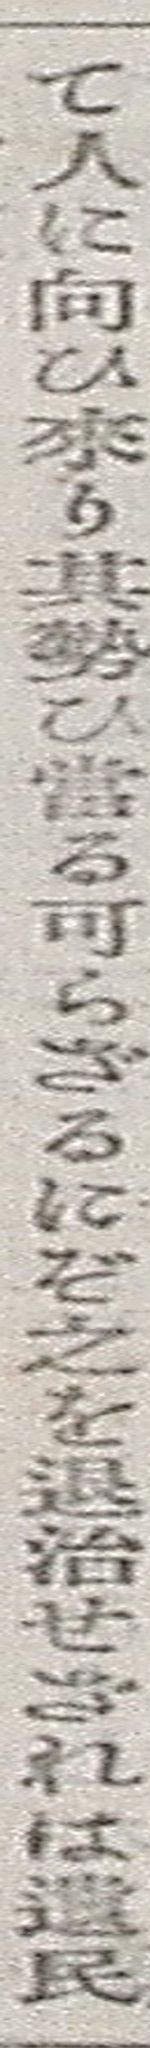て人に向ひ来り其勢ひ当る可らざるにぞ之を退治せざれば遺民
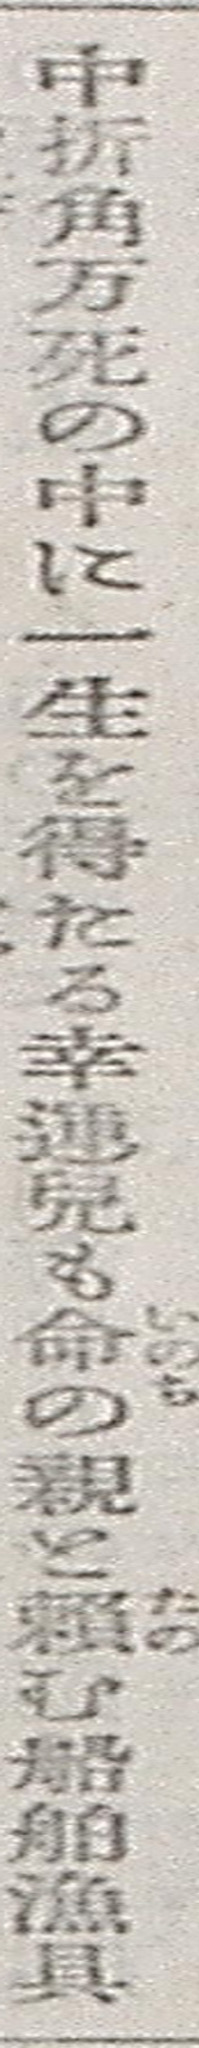中折角万死の中に一生を得たる幸運兒も命の親と頼む船舶漁具
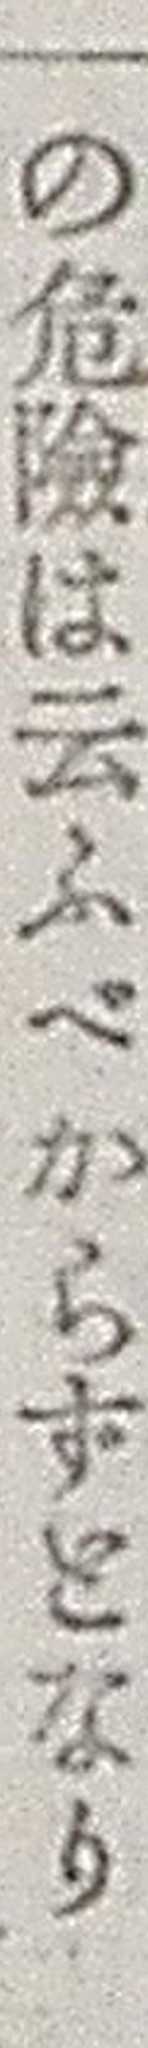の危険は云ふべからずとなり
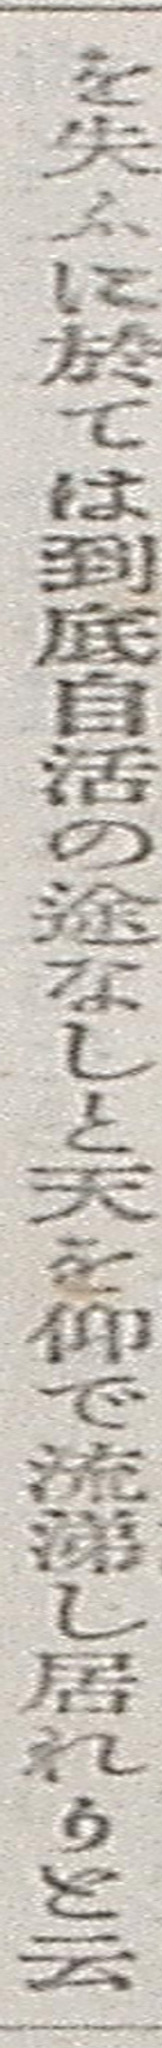を失ふに於ては到底自活の途なしと天を仰で流涕し居れりと云
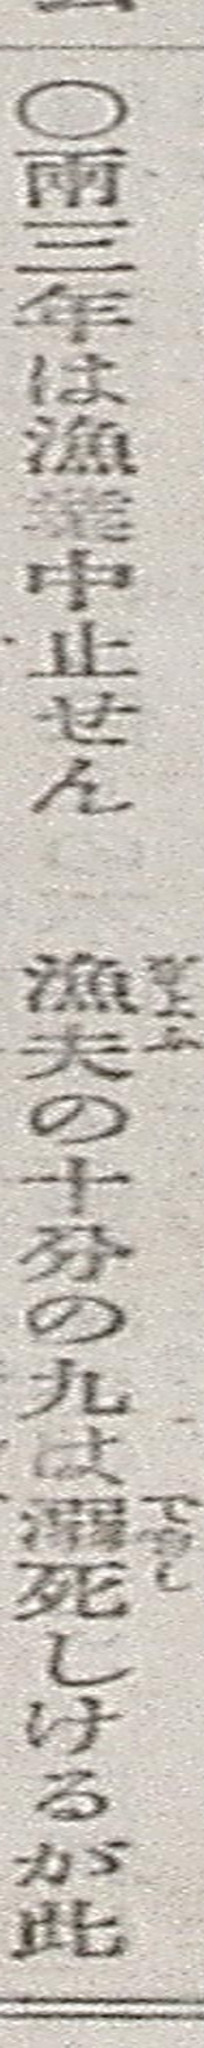○両三年は漁業中止せん漁夫の十分の九は溺死しけるが此
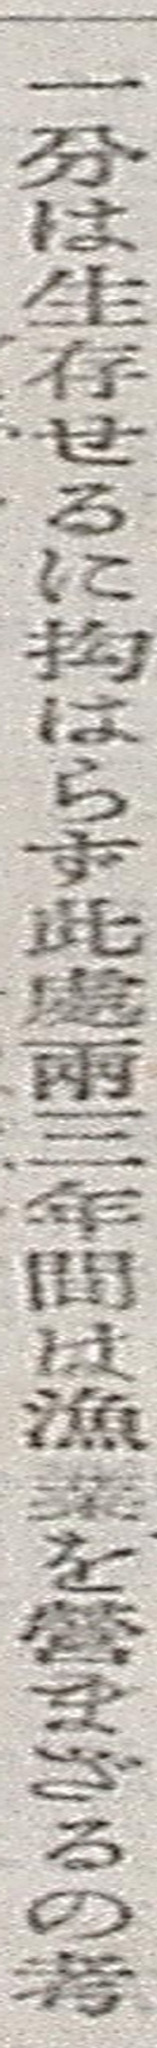一分は生存せるに拘はらず此処両三年間は漁業を営まざるの考
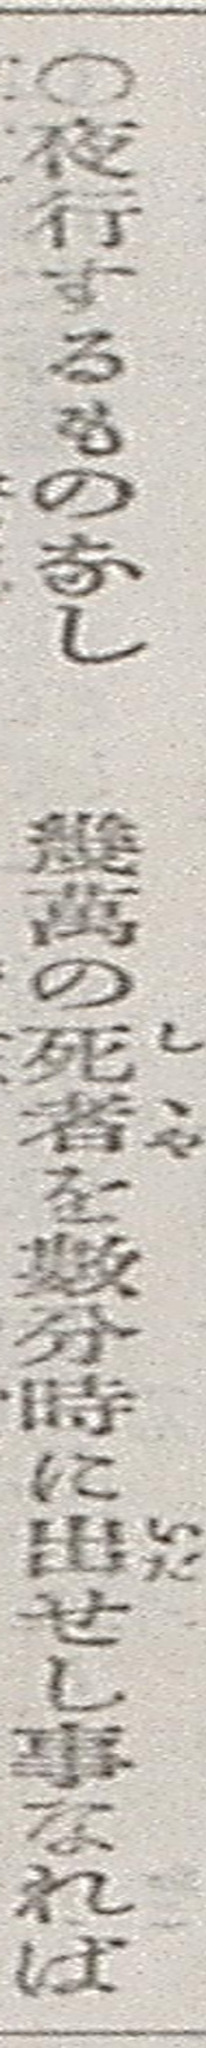○夜行するものなし幾万の死者を数分時に出せし事なれば
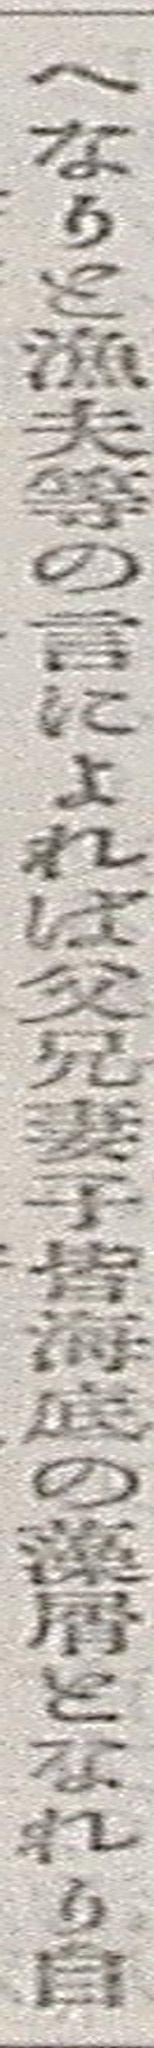へなりと漁夫等の言によれば父兄妻子皆海底の藻屑となれり自
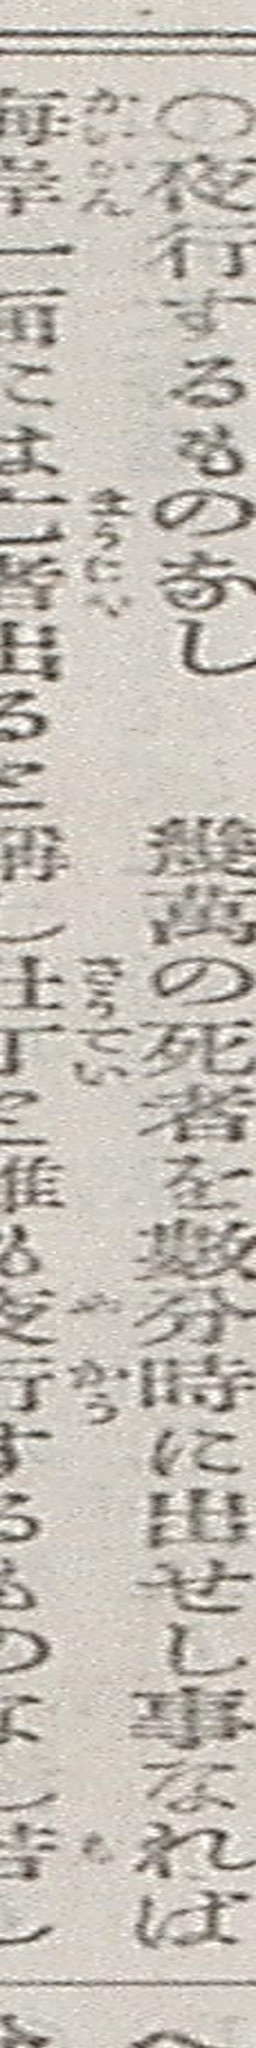海岸一面には亡者出ると称し壮丁と雖も夜行するものなし若し
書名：風俗畫報臨時増刊第百二十號　大海嘯被害録（下）
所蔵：東京大学地震研究所図書室 Earthquake Research Institute Library, The University of Tokyo, JAPAN
